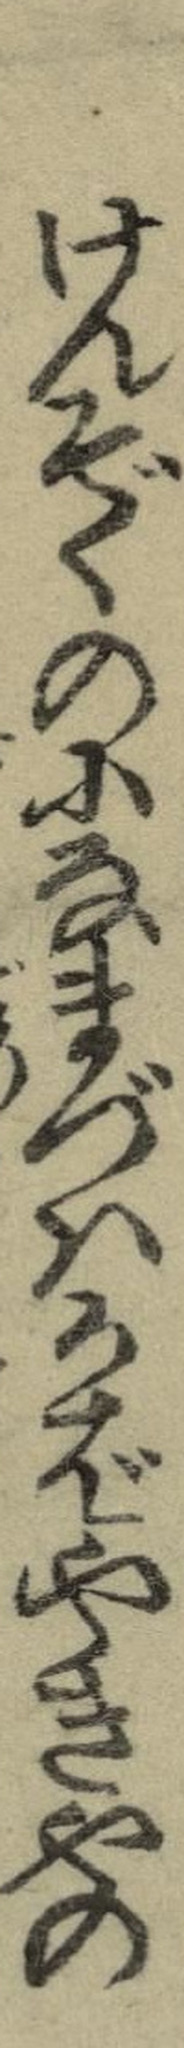けんぞくの小なまづはかばやきやの
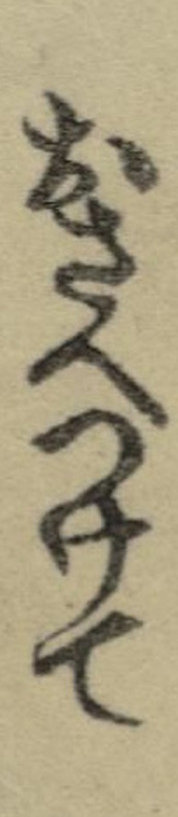おさへつけて
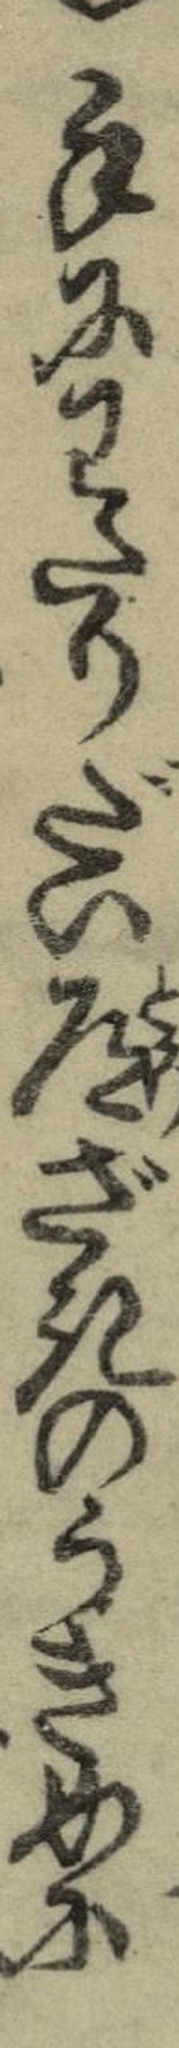手にわたりだい道ざきのうきめに
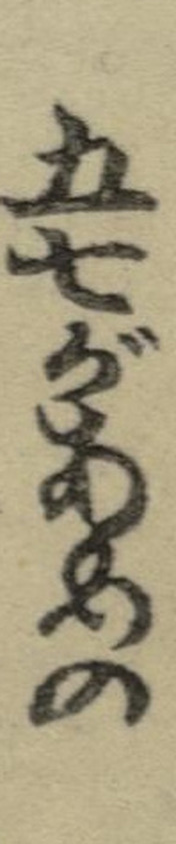五七があめの
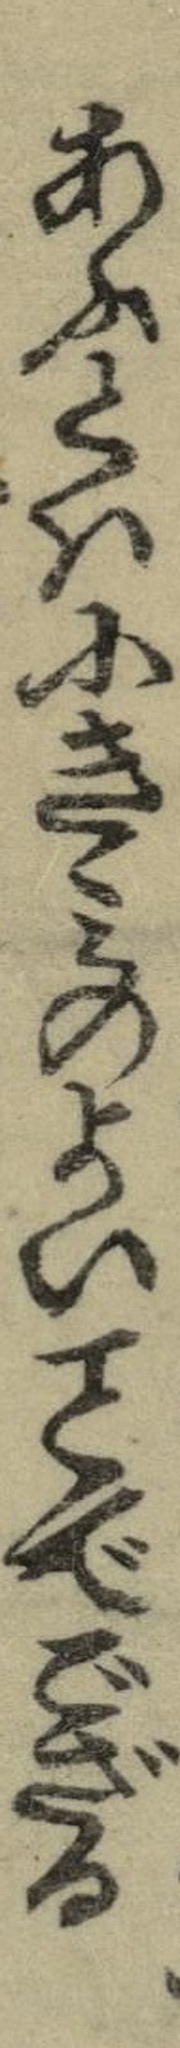あふとは小きみのよいことでござる
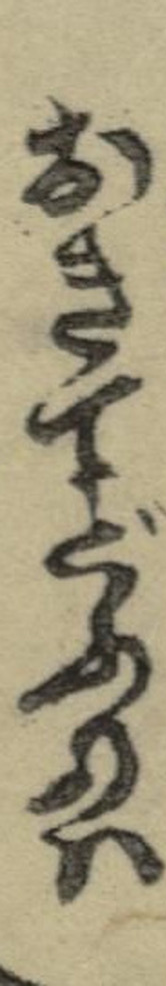おきてどふりは
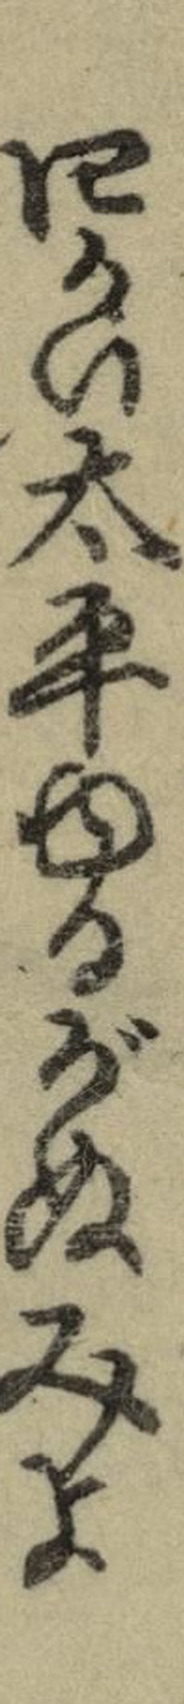四かい太平ゆるがぬみよ
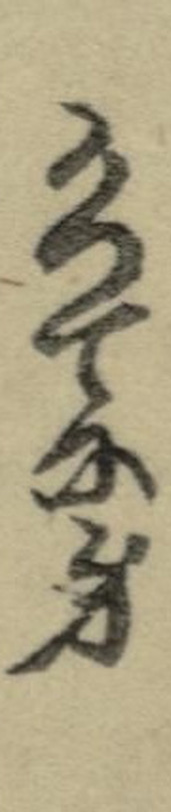かつてに身
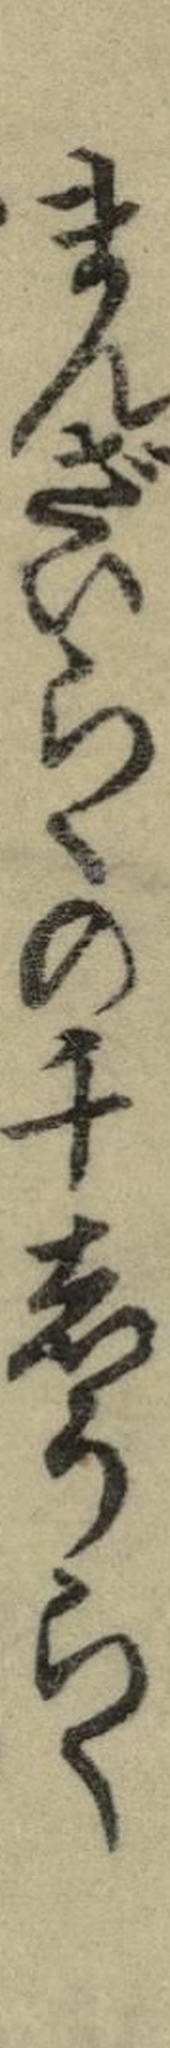まんざいらくの千しうらく
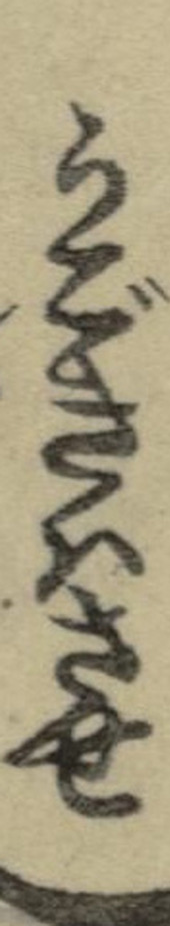うごきはさせ
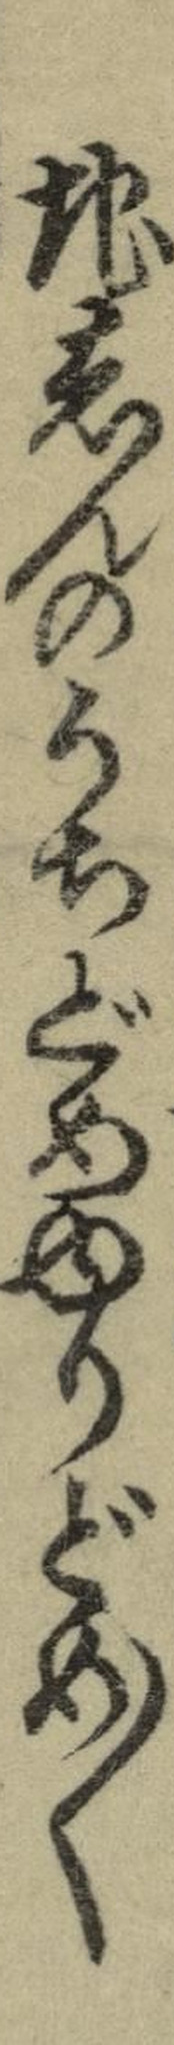地しんのうちどめゆりどめ〳〵
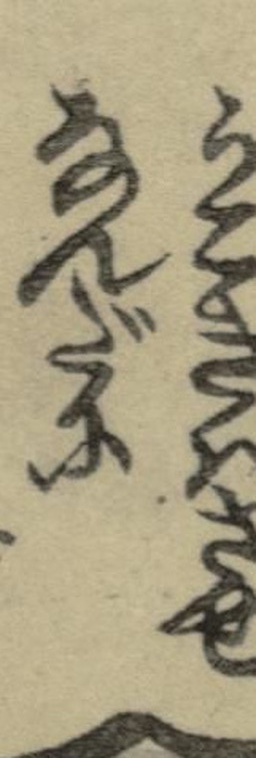なんだに
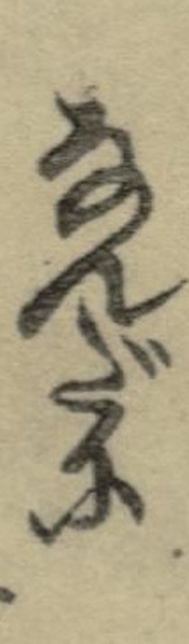なんだに
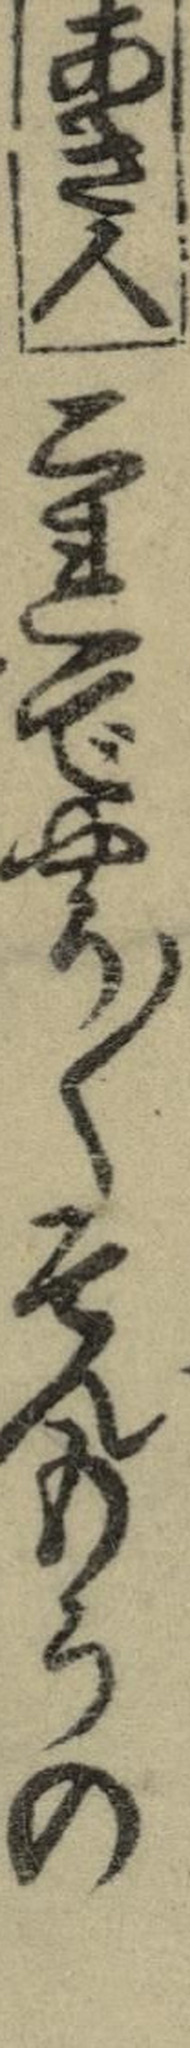あき人これでやう〳〵そんもうの
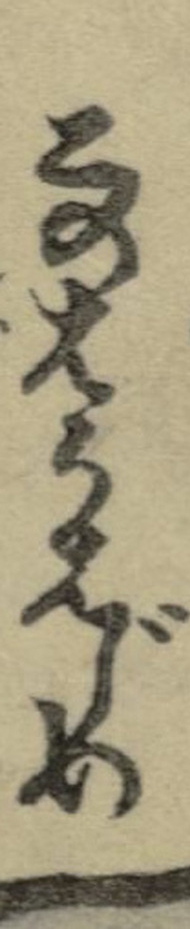このはうはじめ
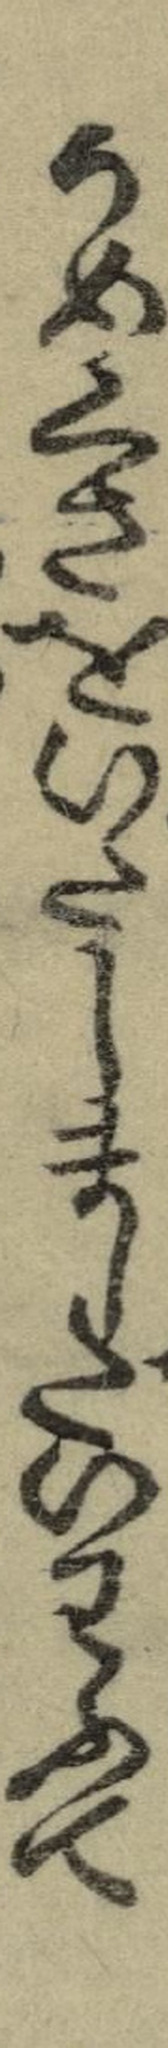うめくさをいたしましたいわふて
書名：おそろ感心要石
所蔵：東京大学地震研究所図書室 Earthquake Research Institute Library, The University of Tokyo, JAPAN
